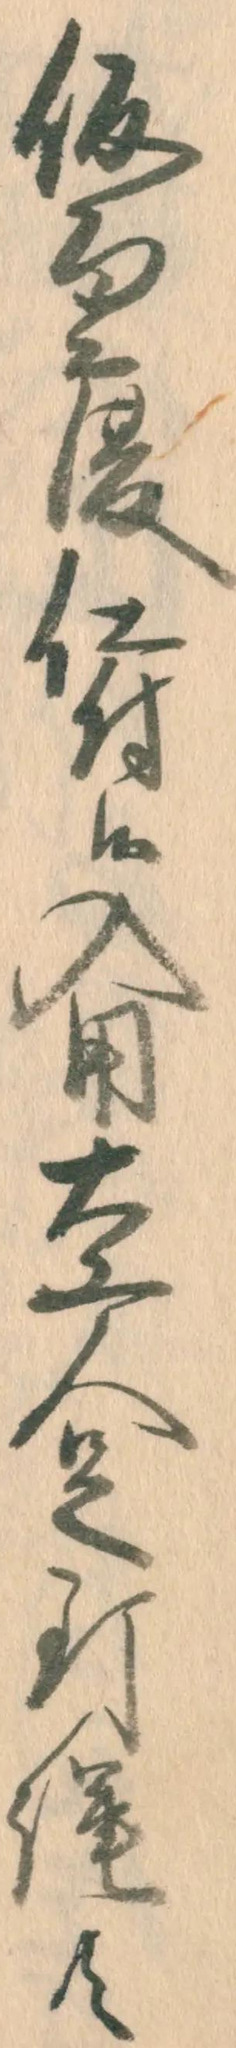仮雨覆志付候入用大工人足釘縄共
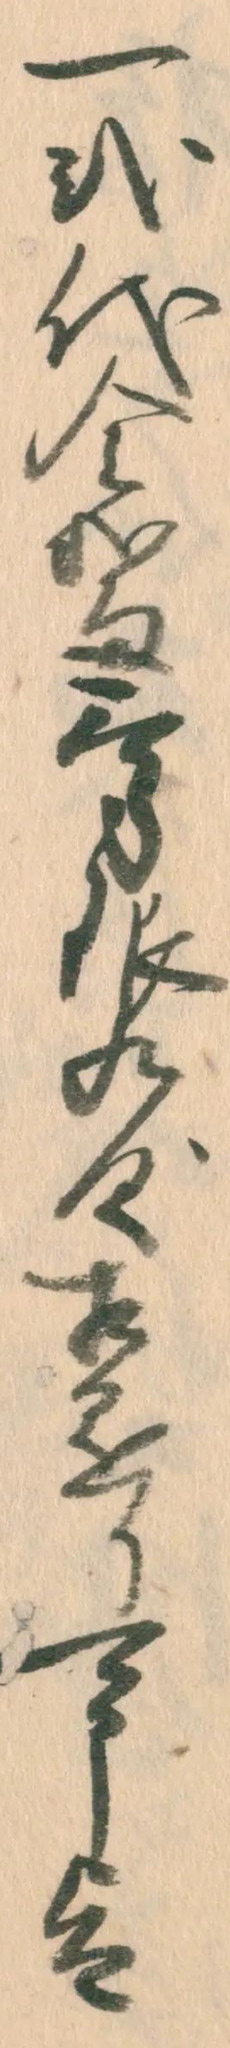一式代金弐両三分銀九匁相懸り可申旨
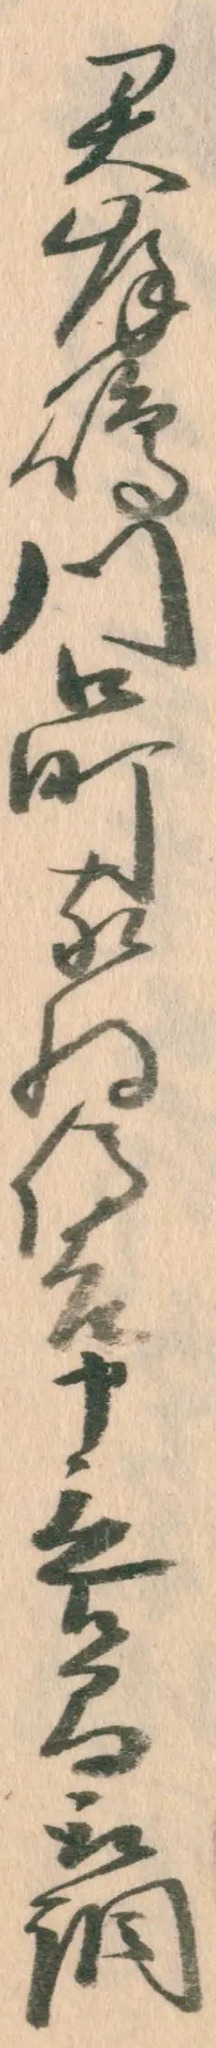霊岸島川口町家持伝吉申立候間取調
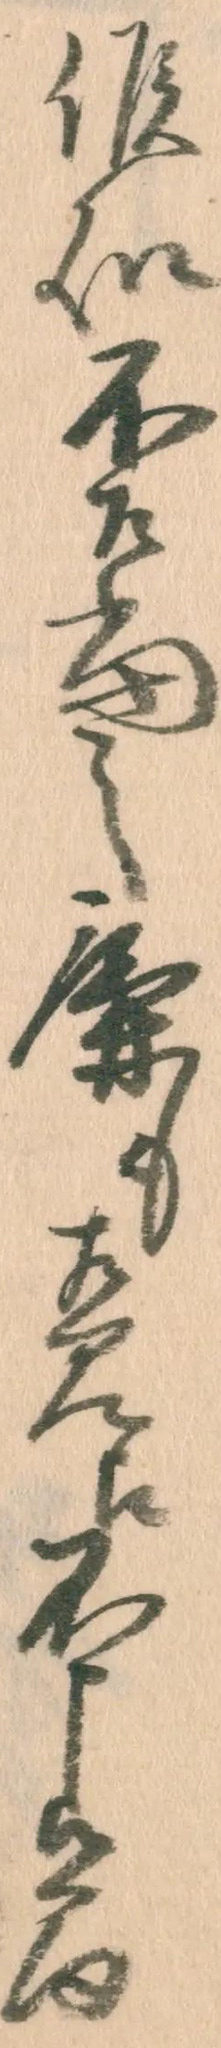候処不相当之廉も相見え不申候間
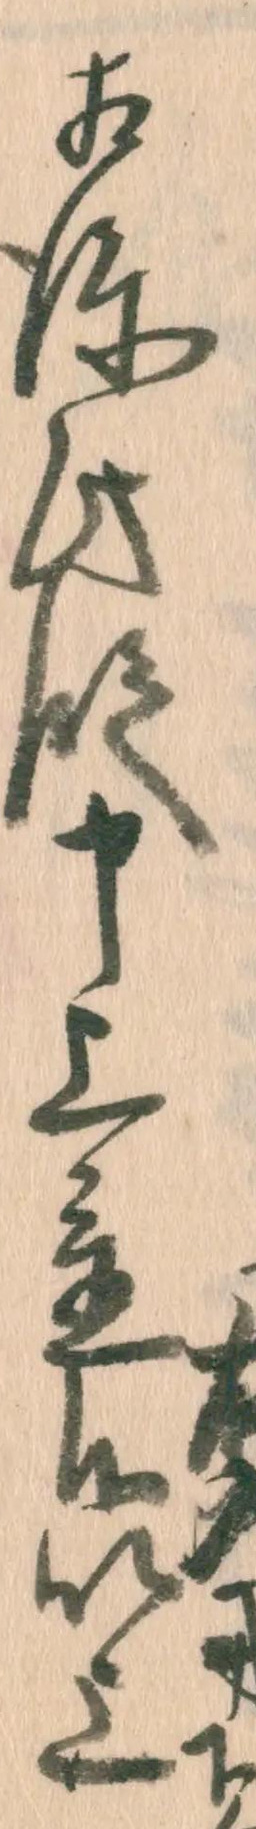相添此段申上置候以上
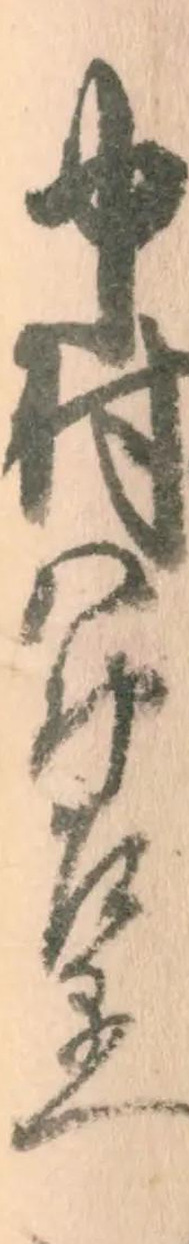中村八郎左衛門
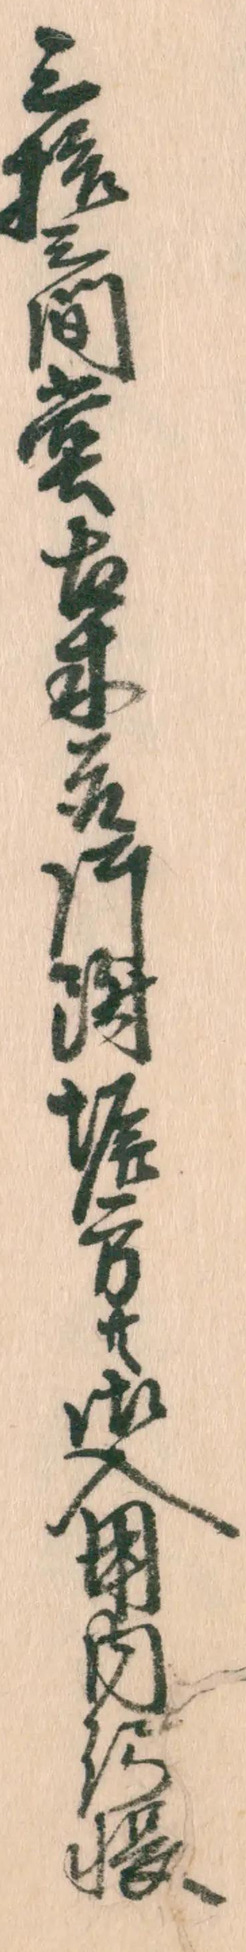三拾三間堂古木取片付塀方共御入用内訳帳

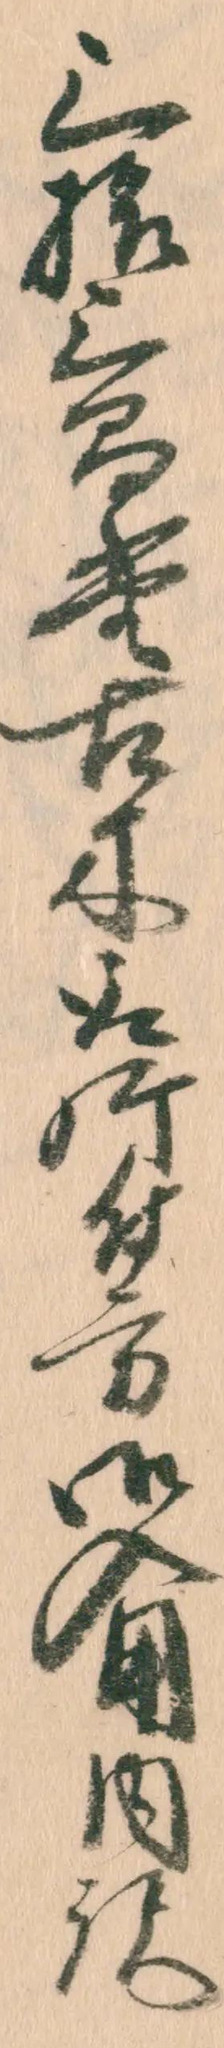三拾三間堂古木取片付方御入用内訳
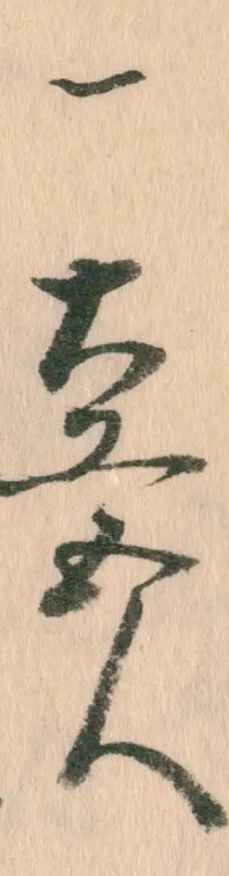一大工五人
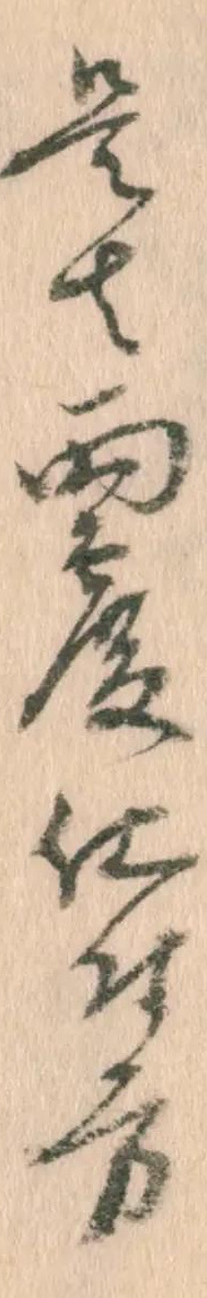是は雨覆仕付方
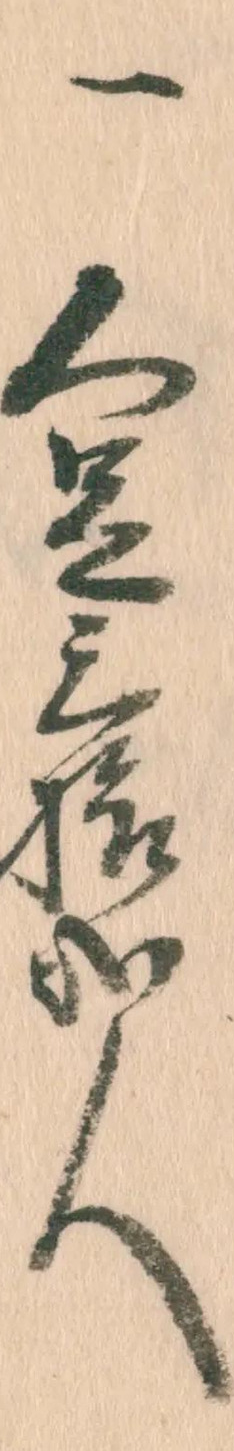一人足三拾弐人

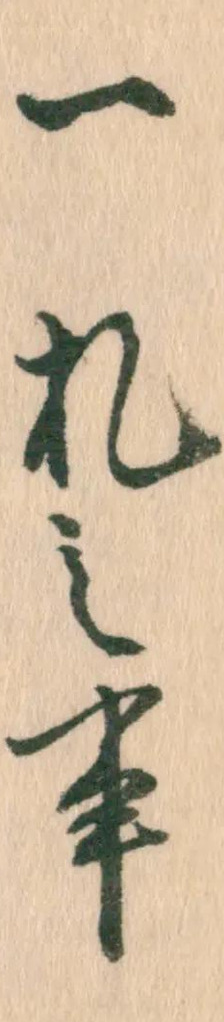一札之事
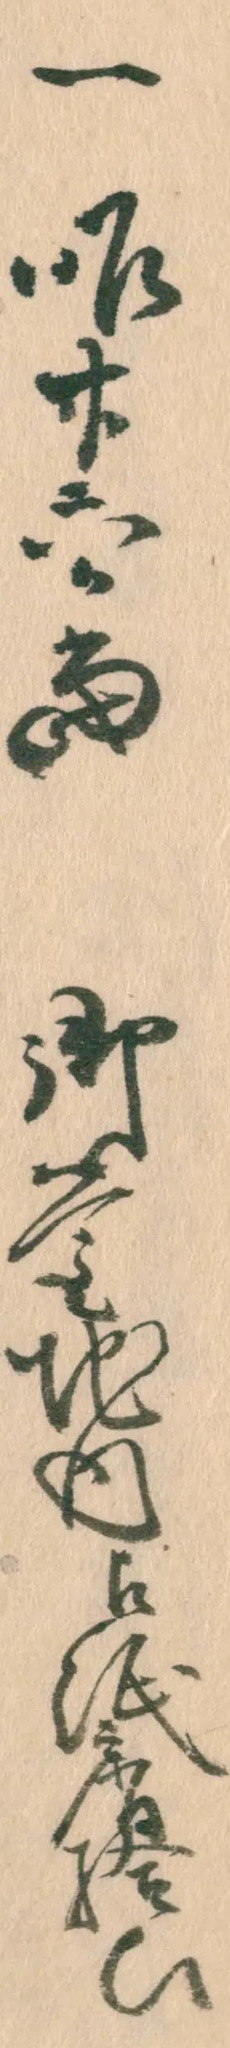一昨廿六日当御堂地内え紙屑拾ひ
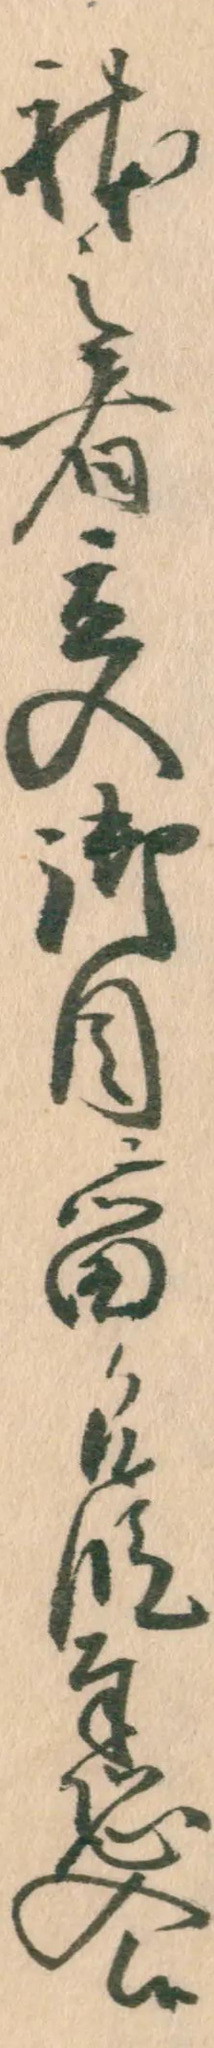体之者立入御目ニ留り候段奉恐入候
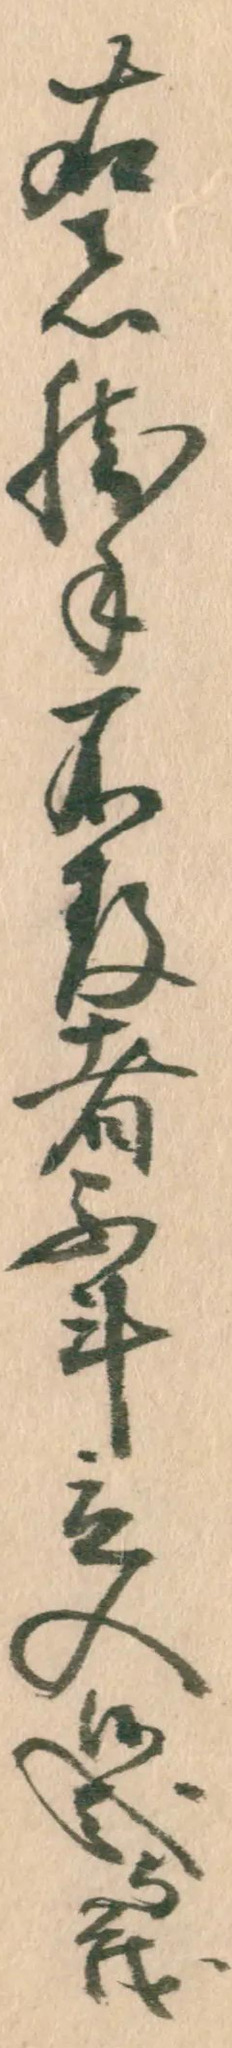右は勝手不存者ふと立入候哉とも

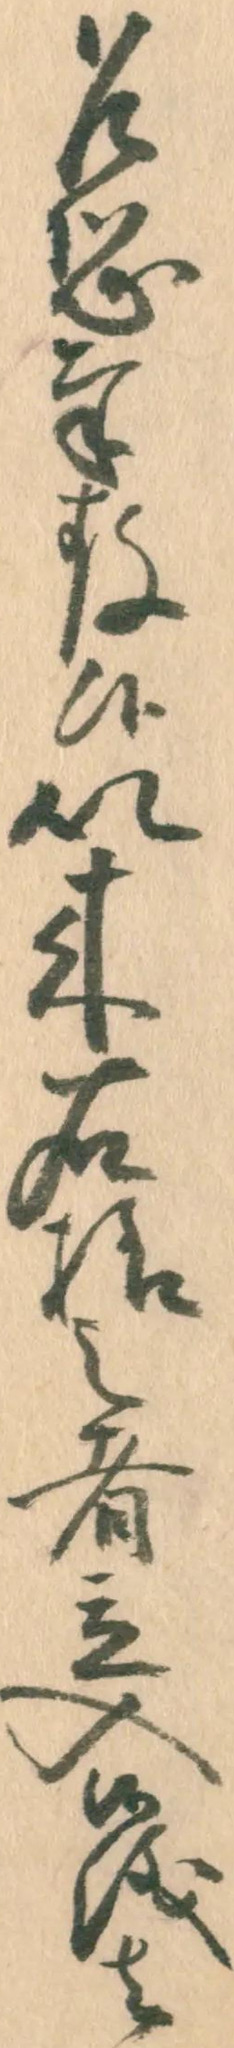乍恐奉存候以来右様之者立入候儀は
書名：三十三間堂. [2]
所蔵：国立国会図書館 National Diet Library, JAPAN
